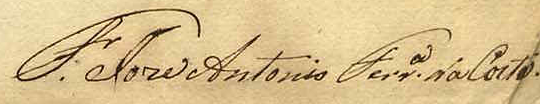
F.r Ioze Antonio Ferr.a da Costa
